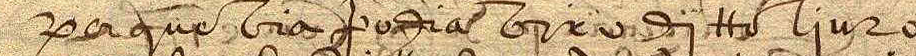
por que via podia vir o djtto ljuro
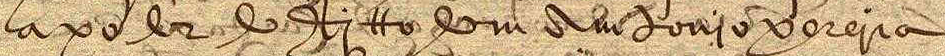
a poder do djtto dom Amtonjo perejra
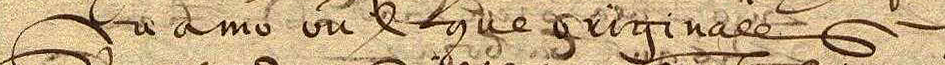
Seu amo ou de que originall se
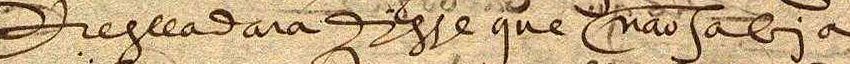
traslladara disse que não Sabja
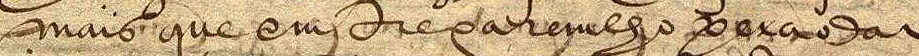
mais que emtregaremlho pera o dar
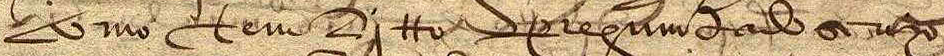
como tem Djtto pregumtado se ujo
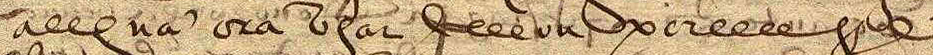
allguā ora vsar delle ou per elle lhe
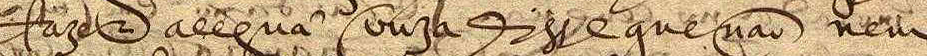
fazer allguā Couza disse que não nem
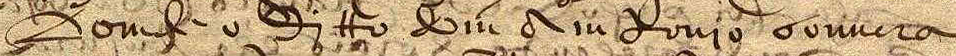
Domde o djtto dom Amtonjo o ouuera
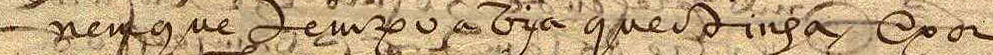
nem que tempo avya que o tinha / e por
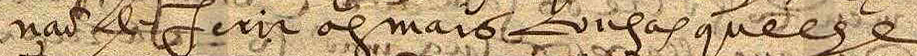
naõ deferir as mais cousas que lhe
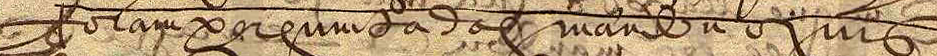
foram pergumtadas mandou o Juis
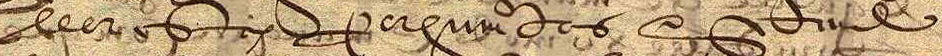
ller estas pergumtas e Semdo
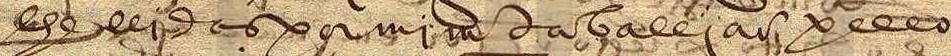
lhe llidas por mjm taballjaõ pello
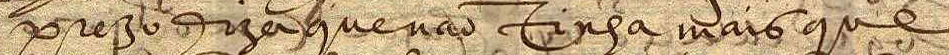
prezo dizer que naõ tinha mais que
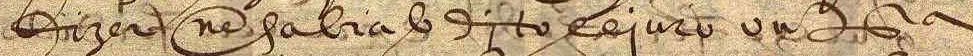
dizer n̄e sabia do djto lljuro outra
